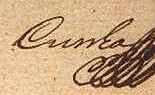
Cunha
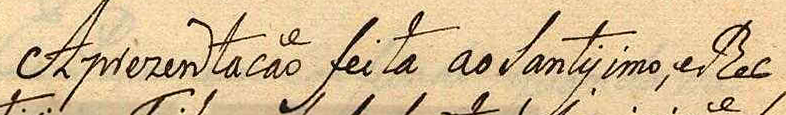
A prezentação feita ao Santisimo, e Rec
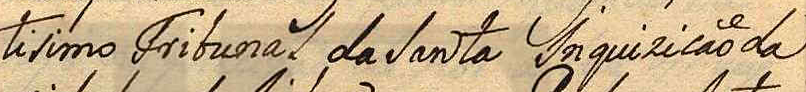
tisimo Tribunal da Santa Inquiziçaõ da
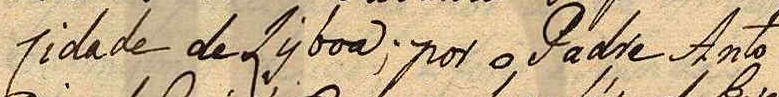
Cidade de Lisboa; por o Padre Anto
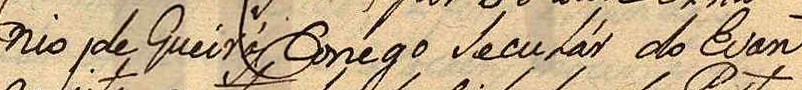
nio de Queirós Conego secuLár do Evan
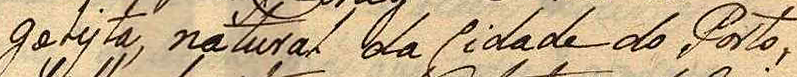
gelista, natural da Cidade do Porto,
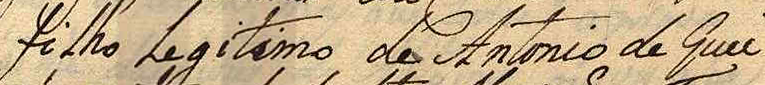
filho Legitimo de Antonio de Quei
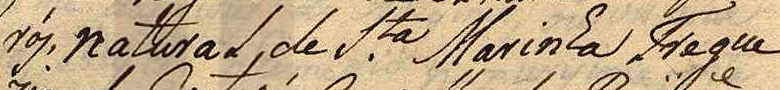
rós, natural, de S.ta Marinha Fregue
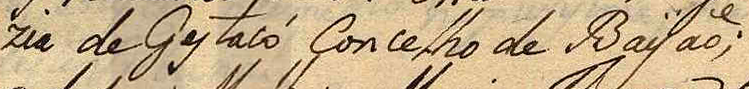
zia de Gestacó Concelho de Bayaõ;
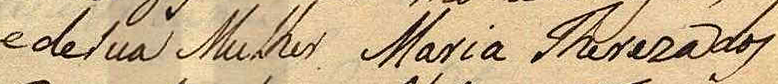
e de sua Mulher Maria Thereza dos
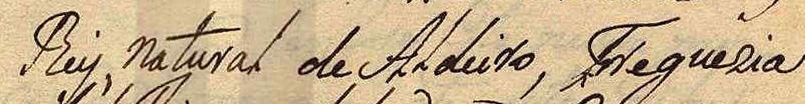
Reis, natural de Aldeiro, Freguezia
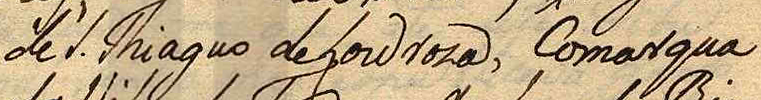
de s. Thiaguo de Louroza, Comarqua
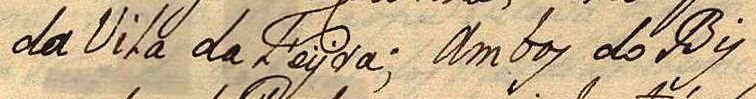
da Vila da Feyra; ambos do Bis
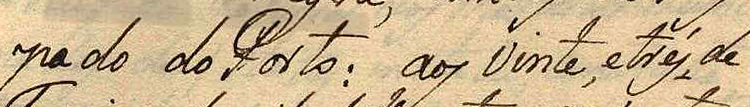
pado do Porto: aos vinte, e trés de
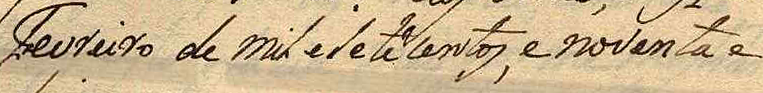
Fevreiro de mil e setecentos, e noventa, e
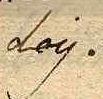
dois.
